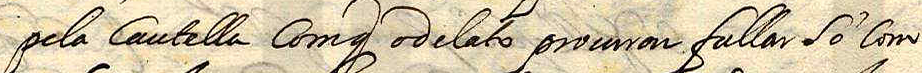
pela Cautella Com q̄ o delato procurou fallar só Com
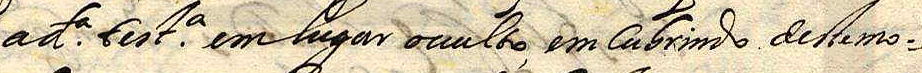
a d̄.a test.a em lugar occulto, emcubrindo deste mo
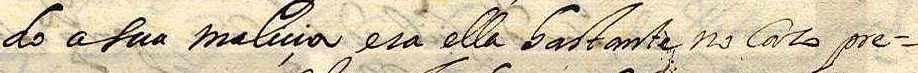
do a sua maliçia era ella bastante no Cazo pre
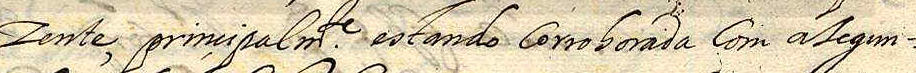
Zente, primçipalm.te estando Corroborada Com a segun
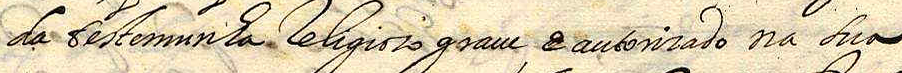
da testemunha Religiozo graue, E autorizado na sua
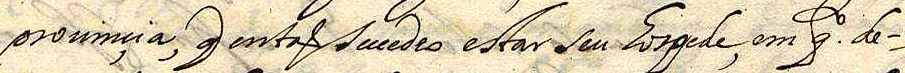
prouinçia, q̄ entaõ sucedeo estar seu hospede, em q.to de
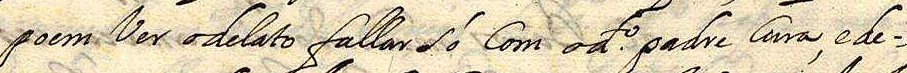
poem ver o delato fallar só Com o d.o padre Cura, e de
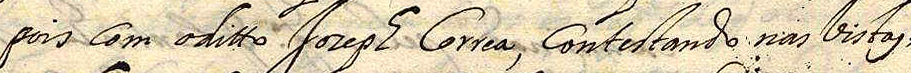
pois Com o ditto Jozeph Correa, Contestando nas vistas
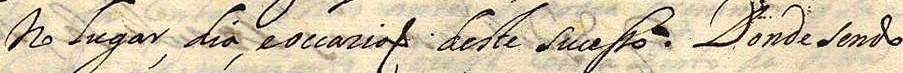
no lugar, dia, e occaziaõ deste sucesso. Donde sendo
